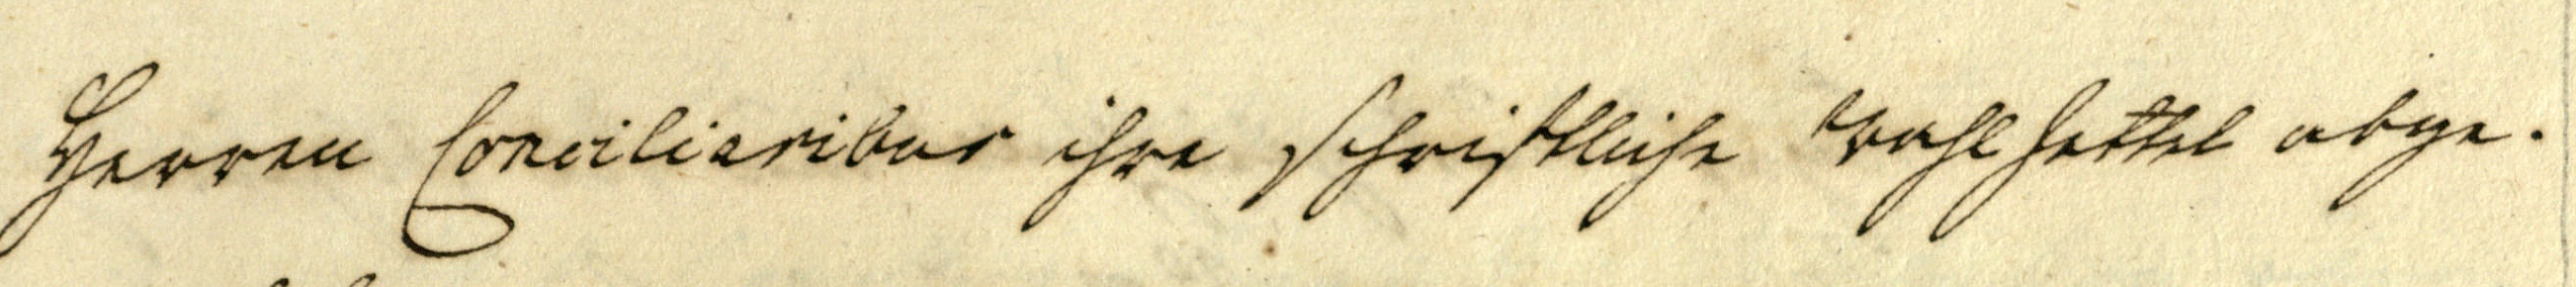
Herren Conciliaribus ihre schriftliche Wahl Zettel abge¬
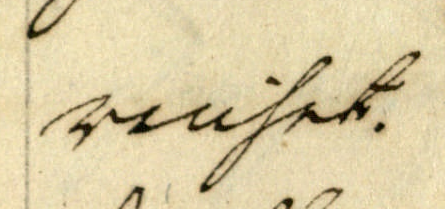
reichet.
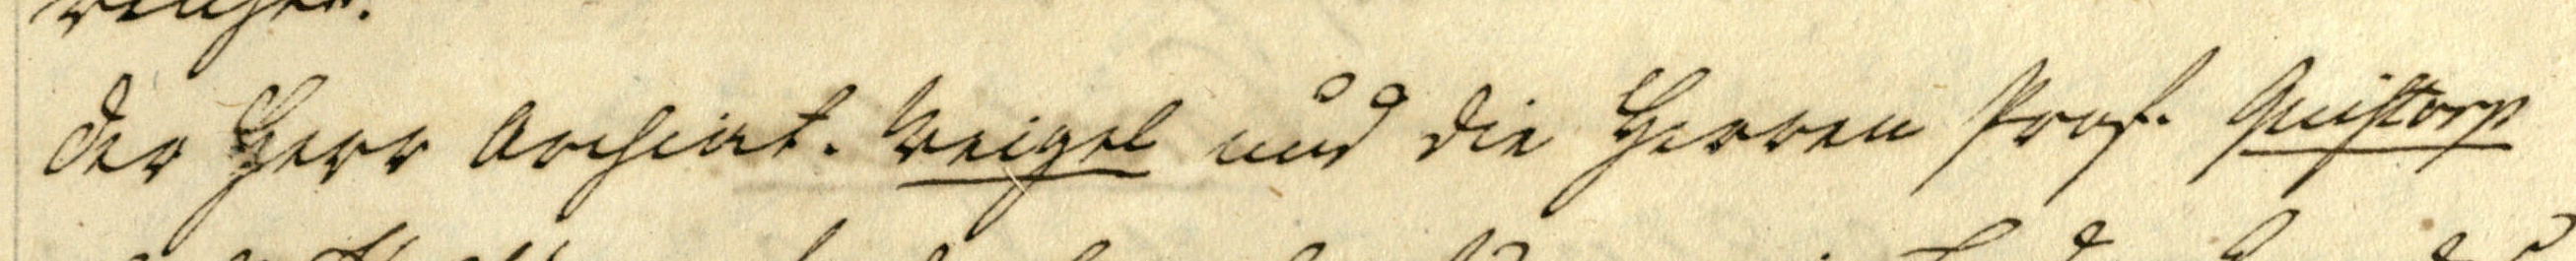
Der Herr Archiat. Weigel und die Herren Prof. Quistorp
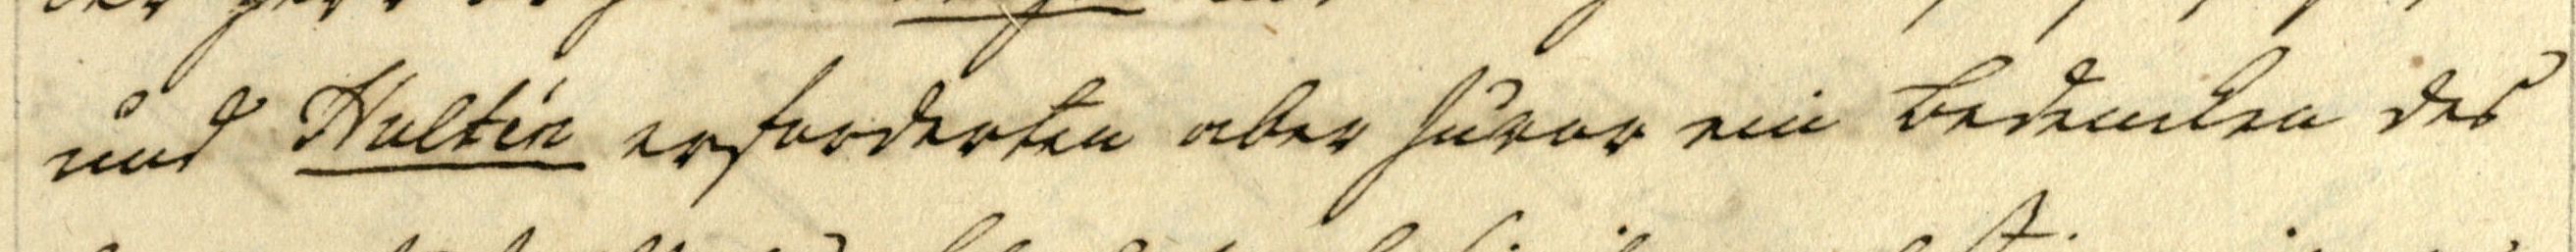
und Hultén erforderten aber zuvor ein Bedencken des
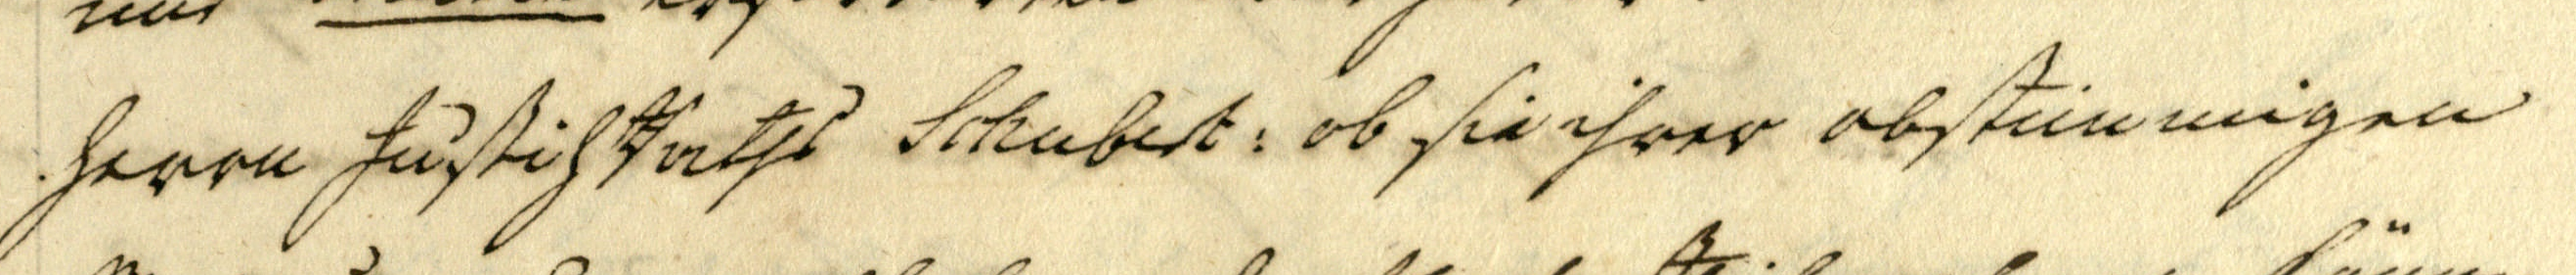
Herrn Justiz Raths Schubert: ob sie ihrer obstimmigen
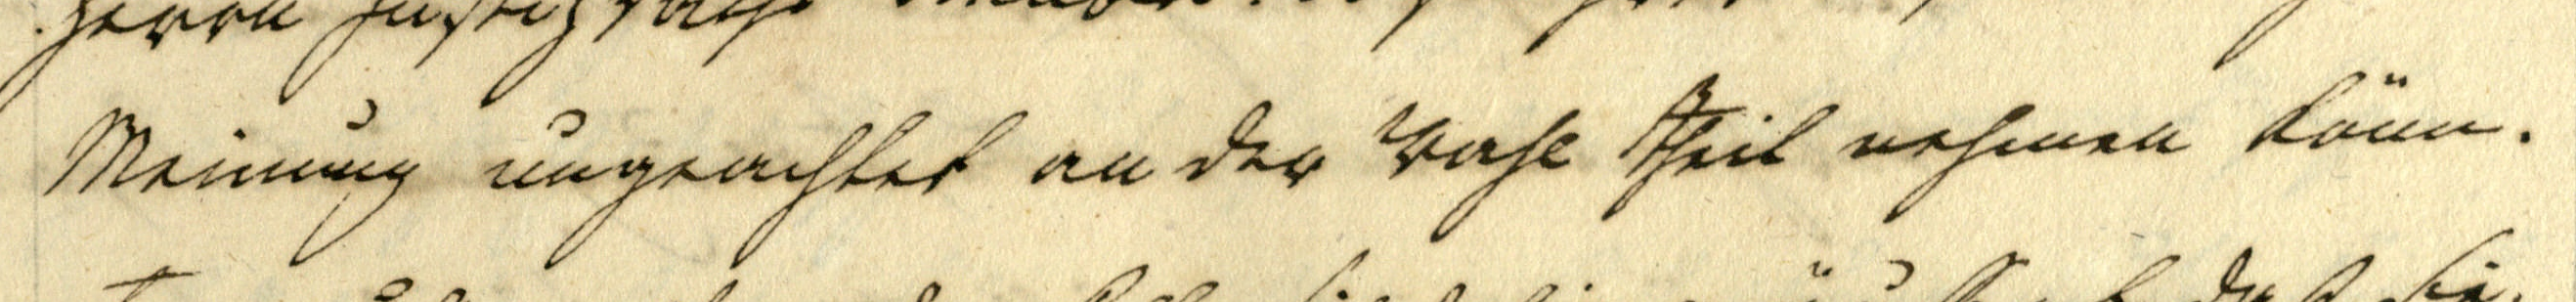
Meinung ungeachtet an der Wahl Theil nehmen könn¬
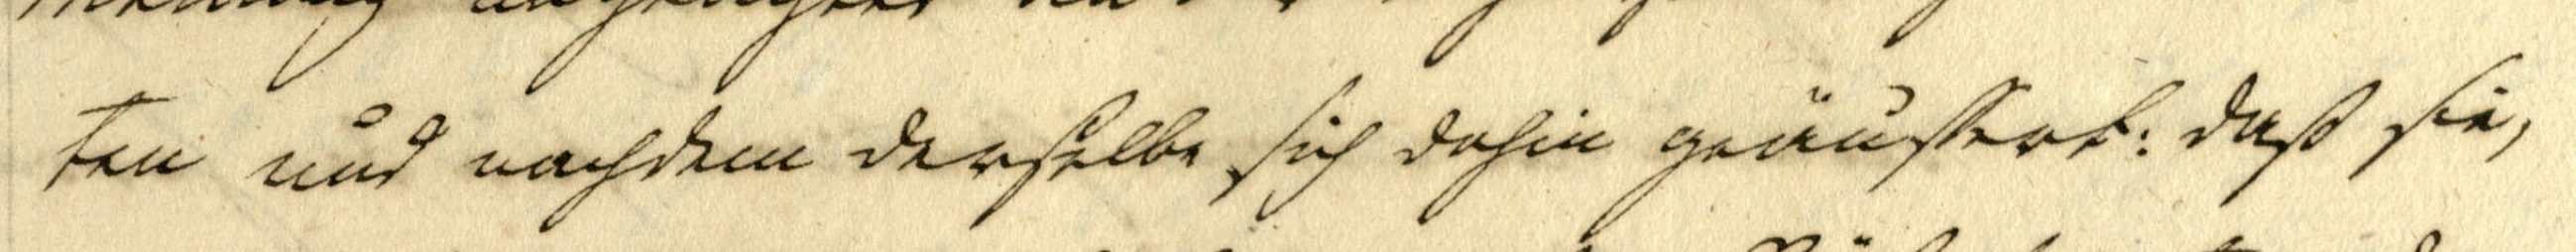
ten und nachdem derselbe sich dahin geäussert: daß sie,
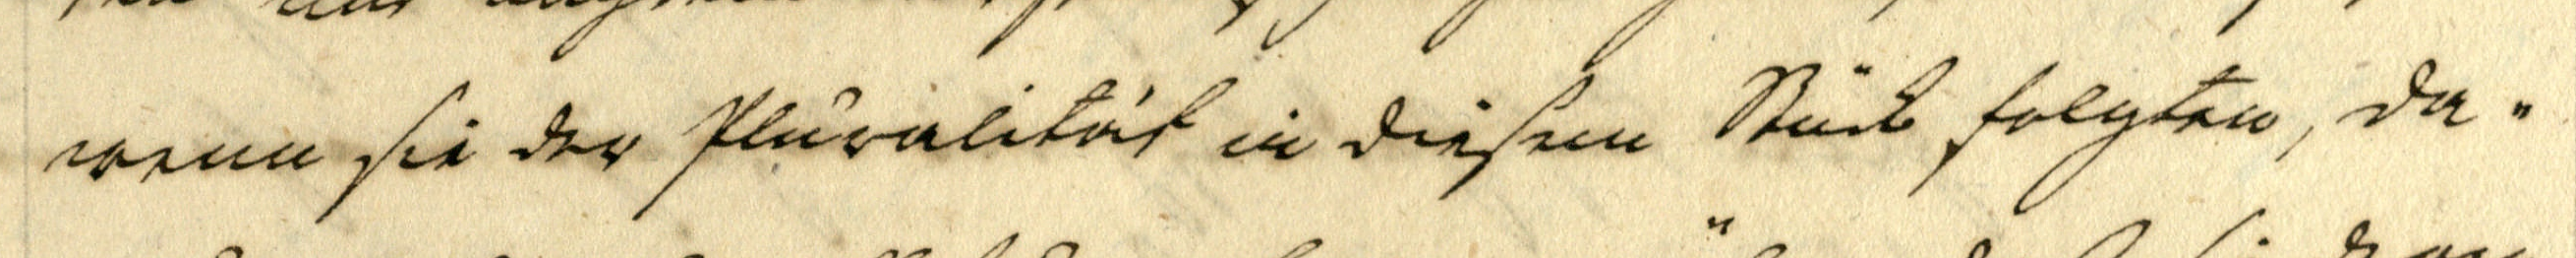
wenn sie der Pluralität in diesem Stück folgten, da¬
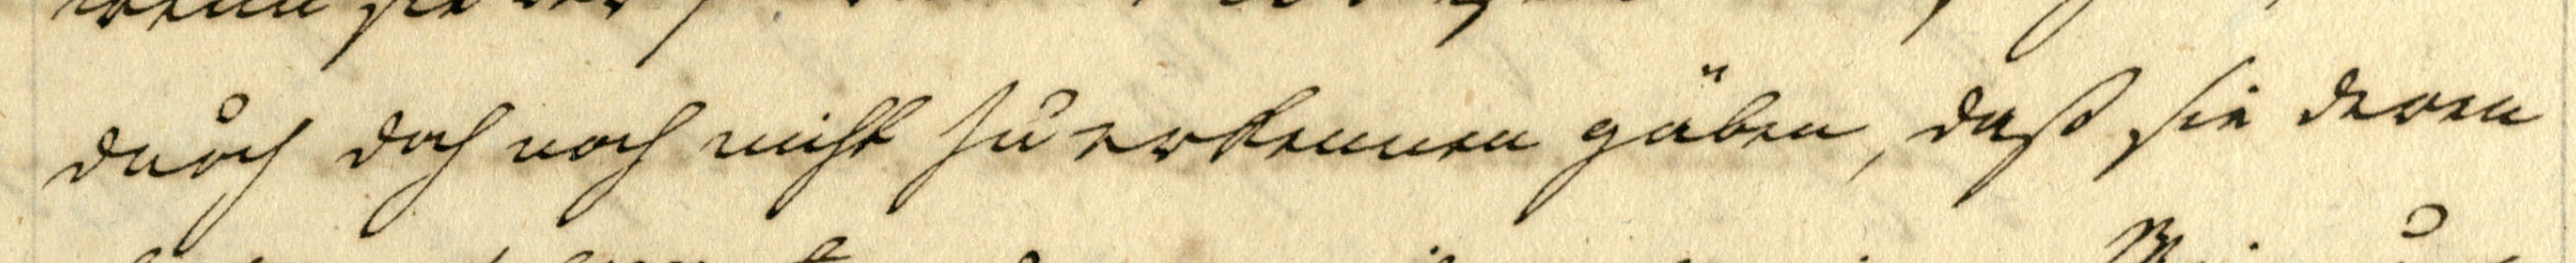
durch doch noch nicht zu erkennen gäben, daß sie deren
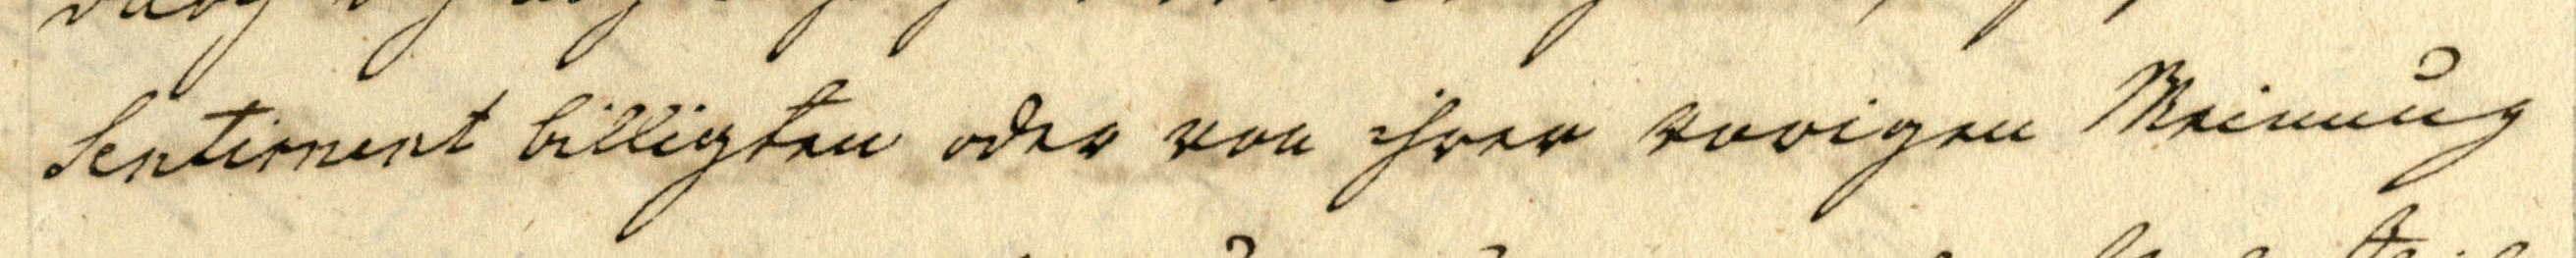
Sentiment billigten oder von ihrer vorigen Meinung
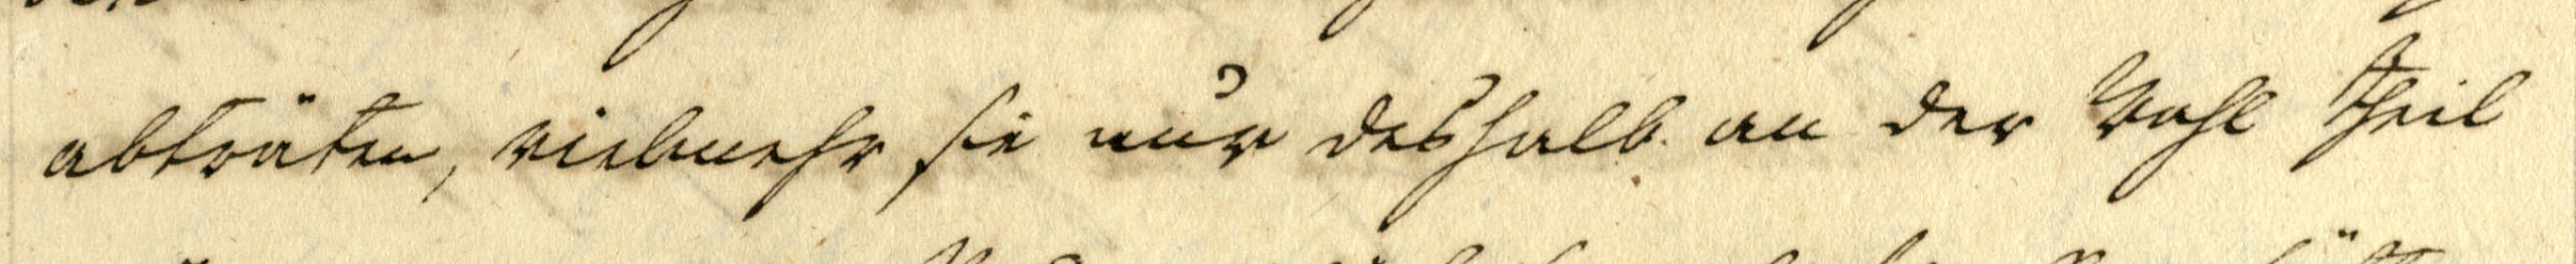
abträten, vielmehr sie nur deshalb an der Wahl Theil
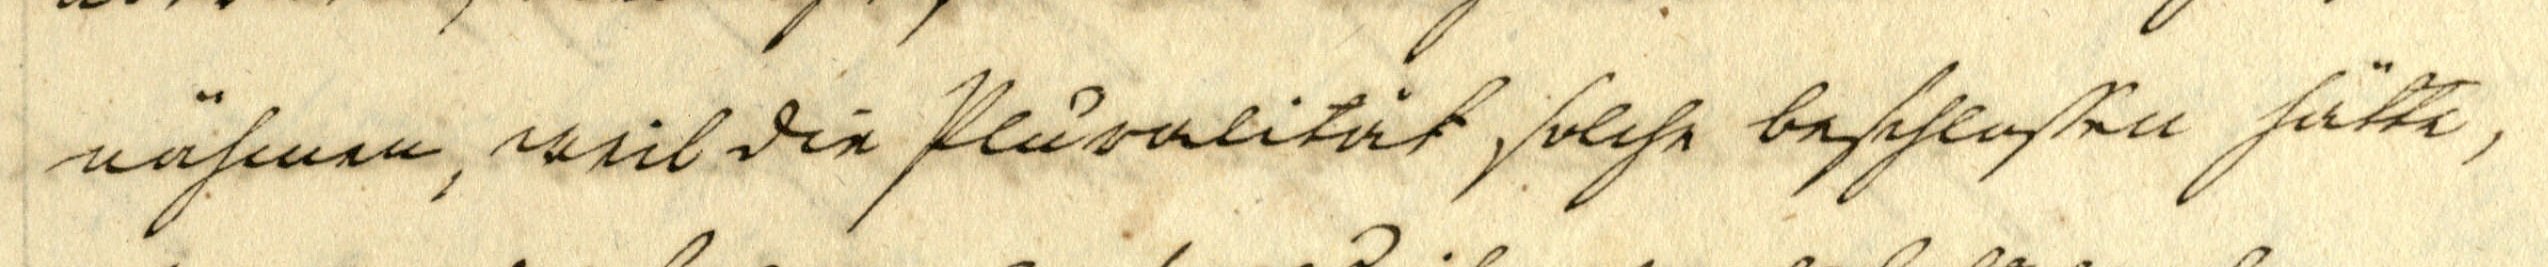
nähmen, weil die Pluralität solche beschlossen hätte,
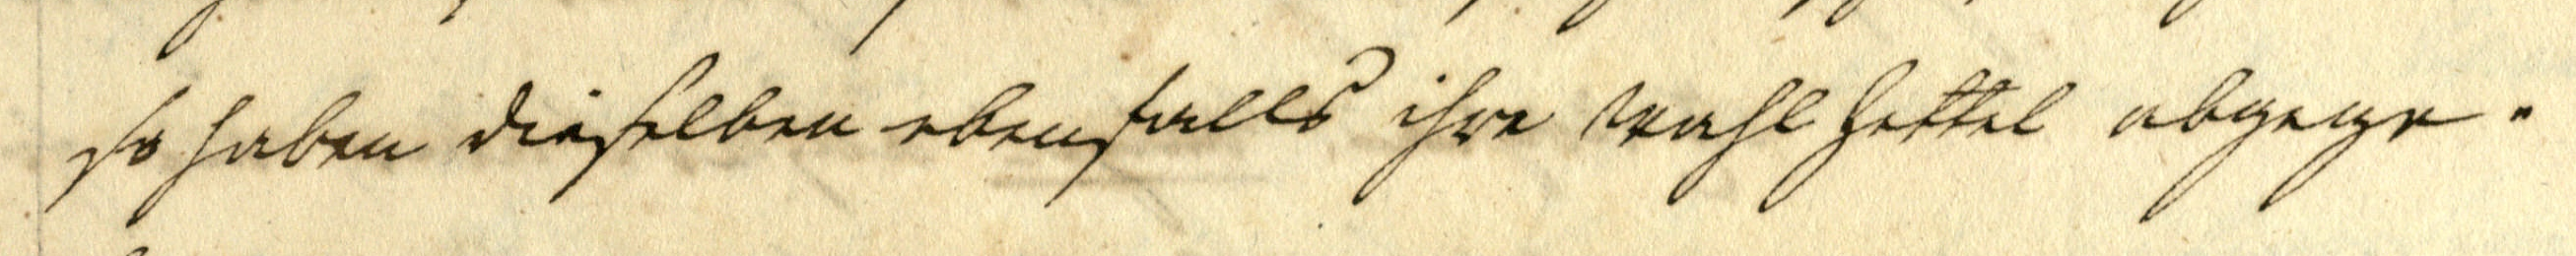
so haben dieselben ebenfalls ihre Wahl Zettel abgege¬
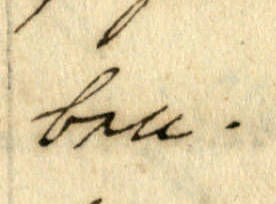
ben.
